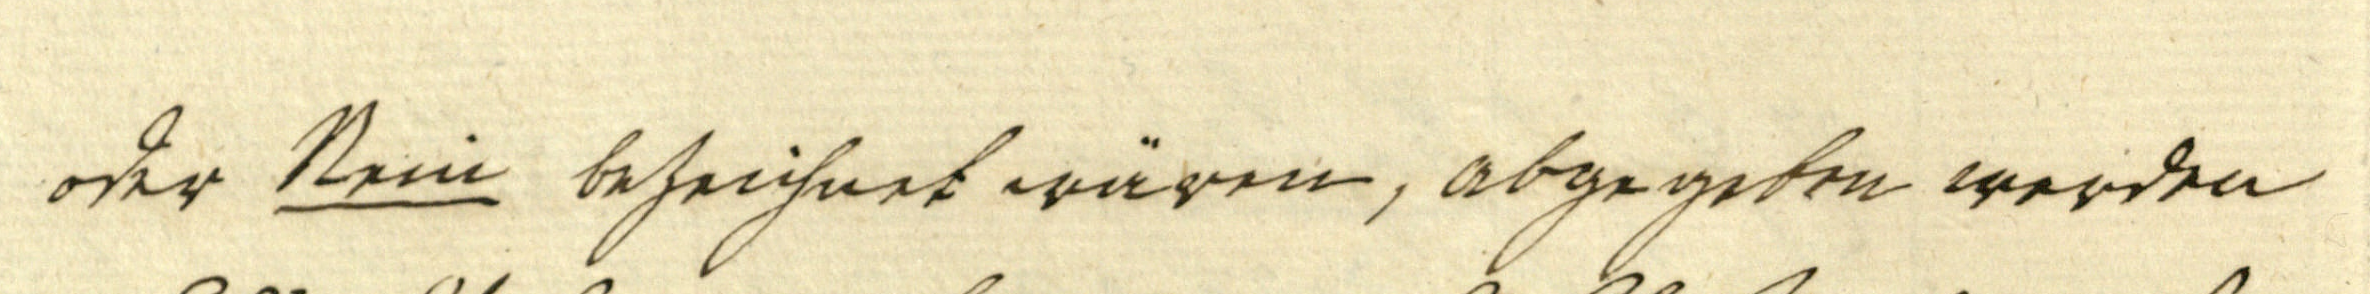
oder Nein bezeichnet wären, abgegeben werden
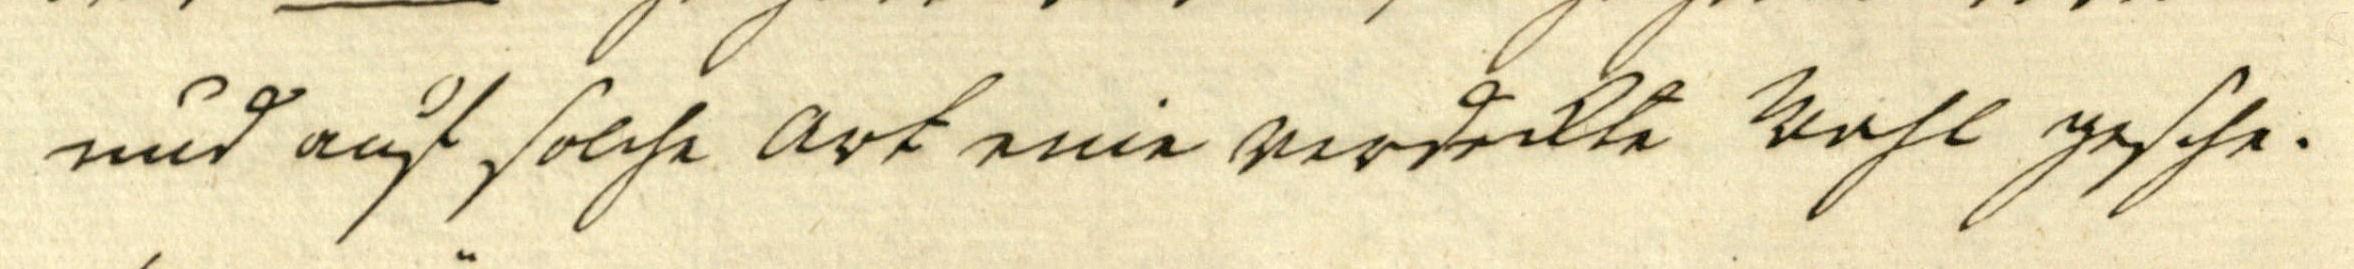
und auf solche Art eine verdeckte Wahl gesche¬
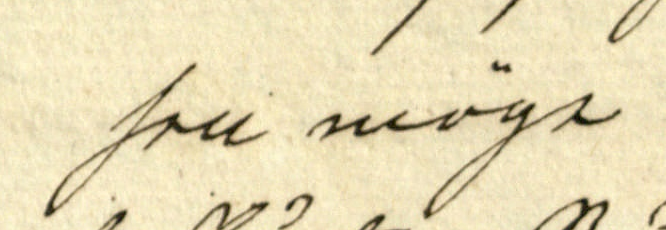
hen möge
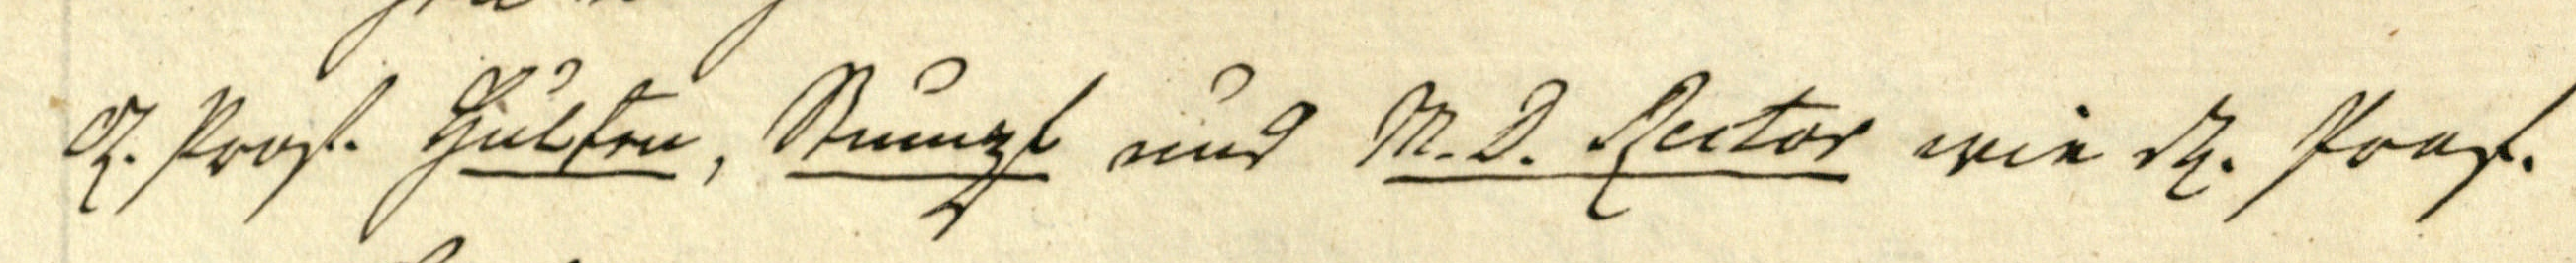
dh. Prof. Hulten, Stumpf und M. D. Rector wie dh. Prof.
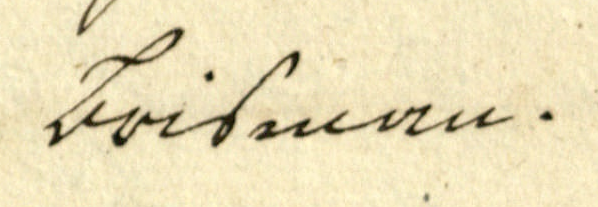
Brisman.
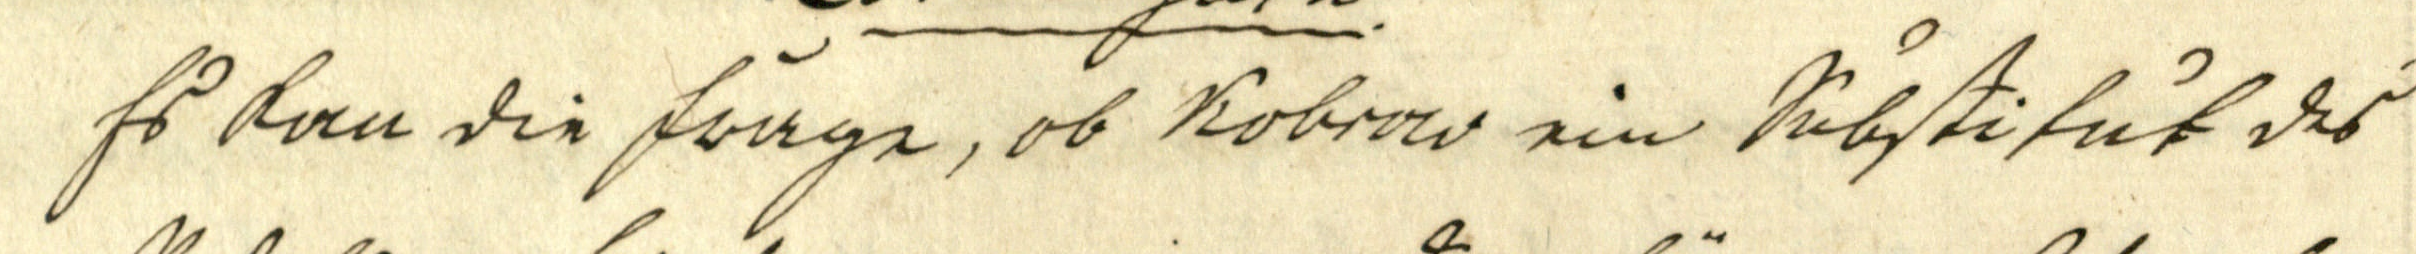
Es kan die Frage, ob Kobrow ein Substitut des
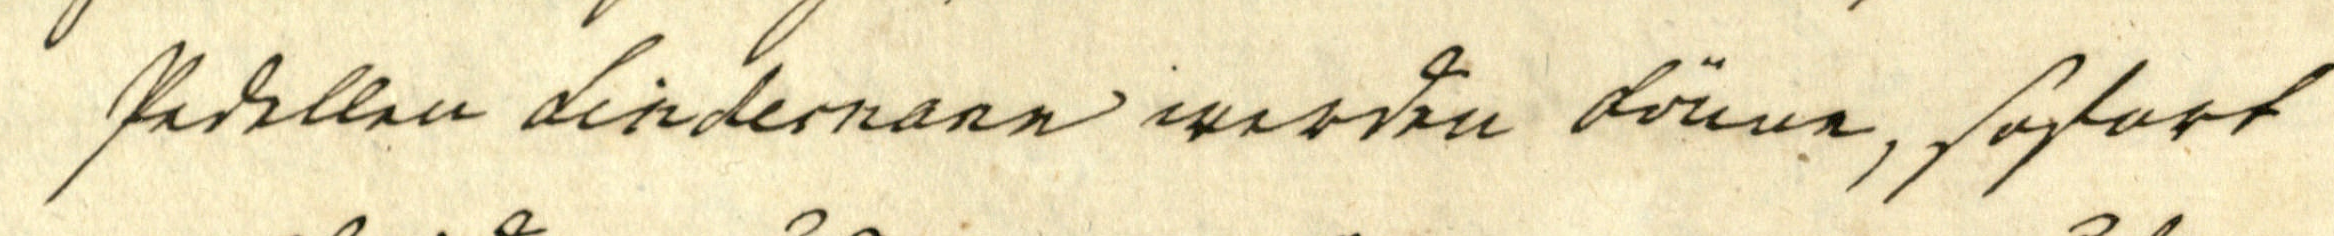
Pedellen Lindemann werden könne, sofort
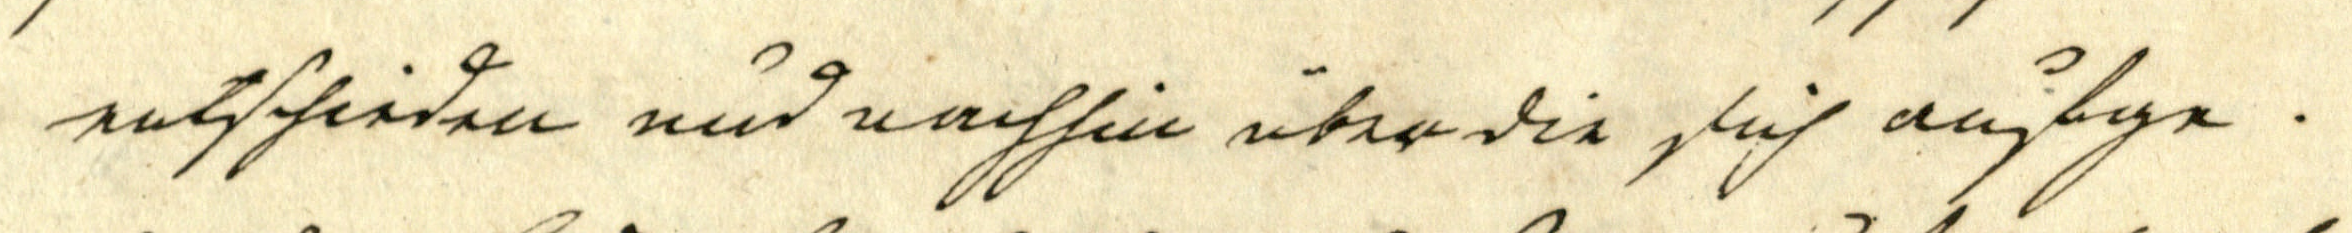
entschieden und nachhin über die sich aufge¬
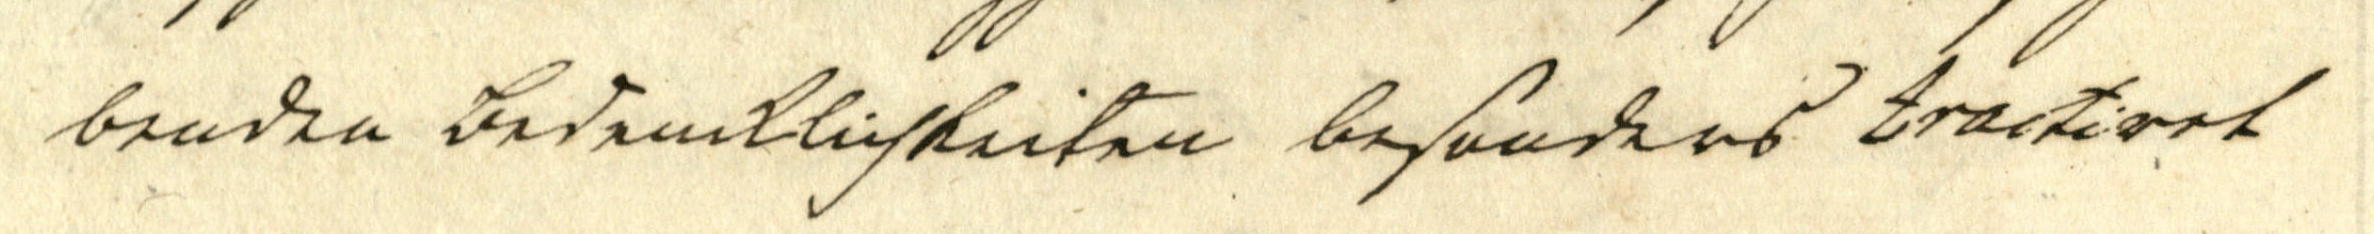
benden Bedencklichkeiten besonders tractiret
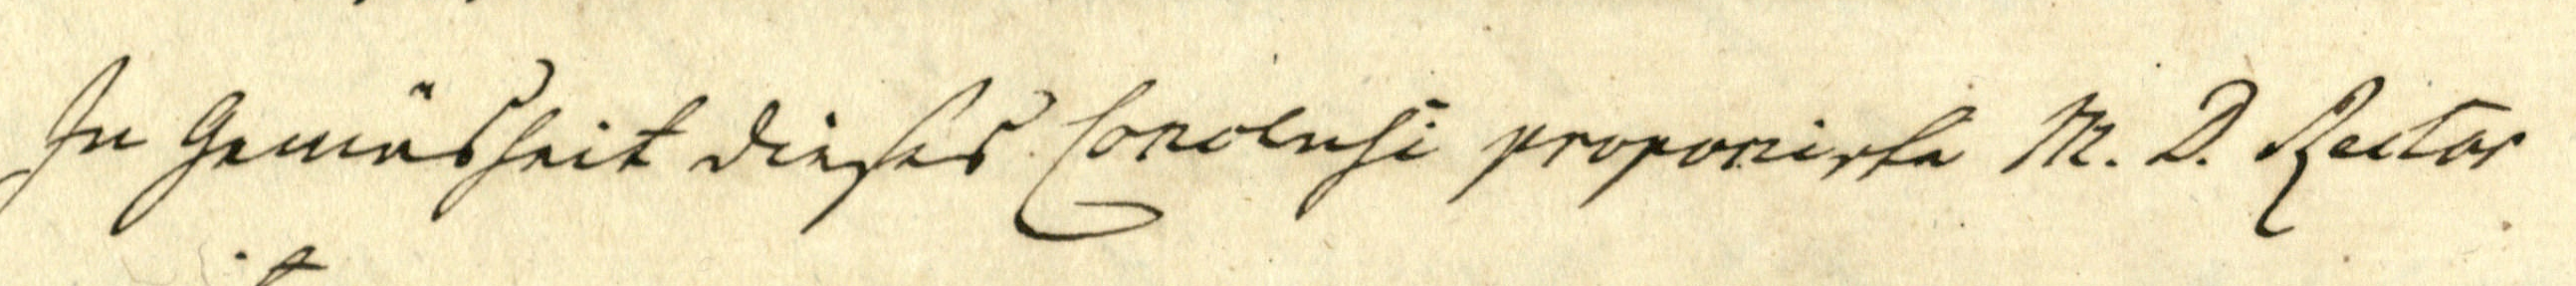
In Gemäsheit dieses Conclusi proponirte M. D. Rector
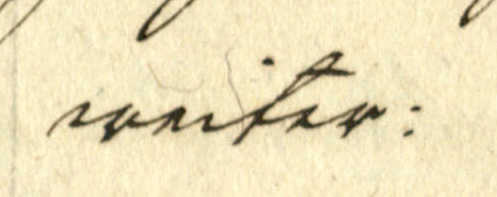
weiter:
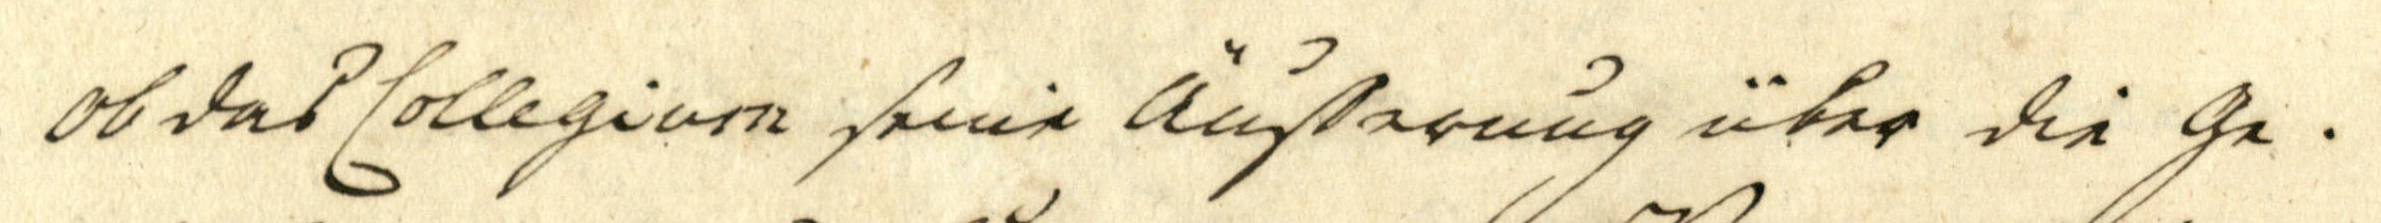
ob das Collegium seine Äusserung über die Ge¬
